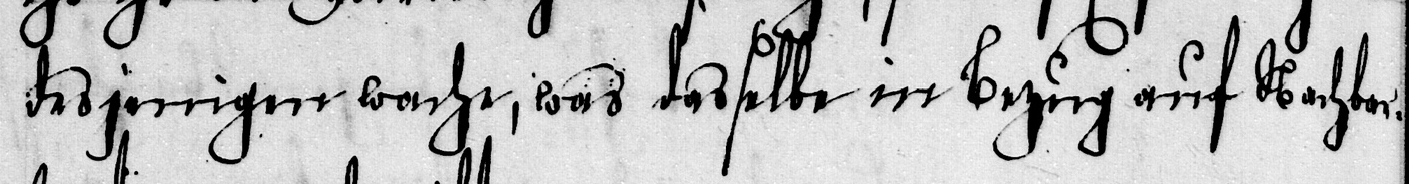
desjenigen wache, was dasselbe in Bezug auf Nachba¬
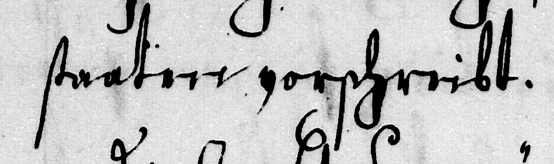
rstaaten vorschreibt.
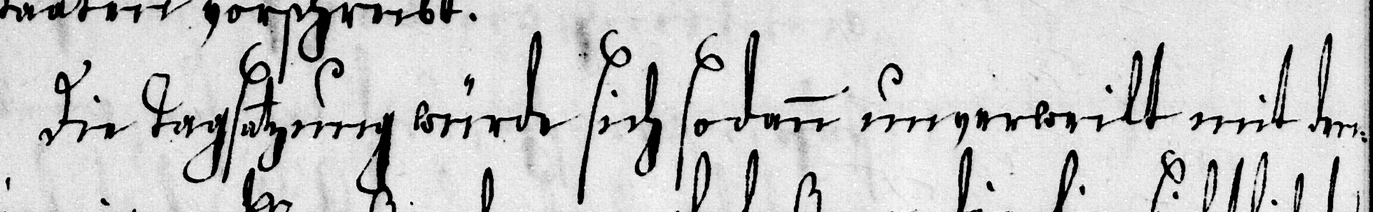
Die Tagsatzung würde sich sodann unverweilt mit de¬
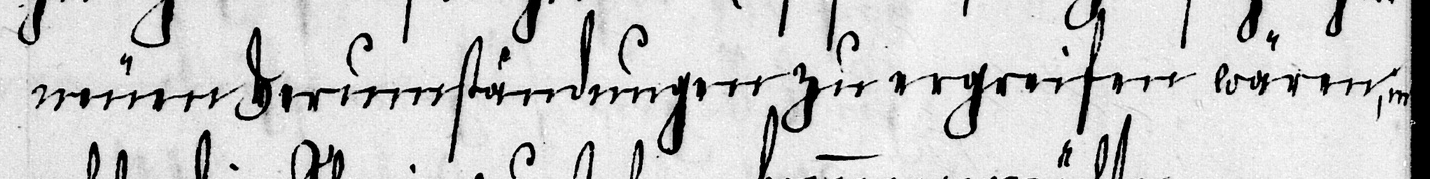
neuen Verumständungen zu ergreifen wären, in
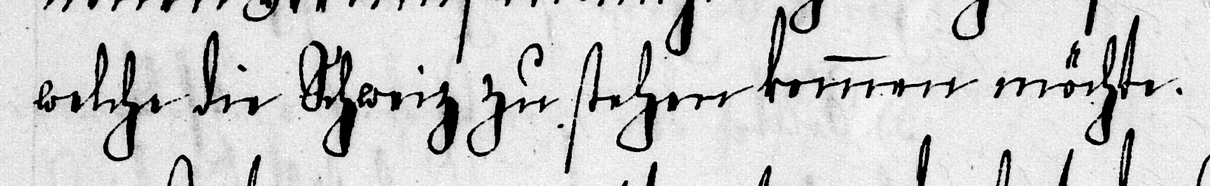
welche die Schweiz zu stehen kommen möchte.
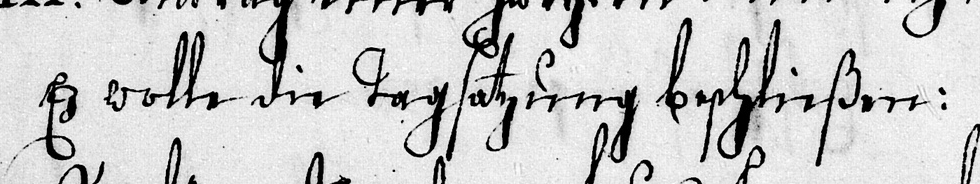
Es wolle die Tagsatzung beschließen:
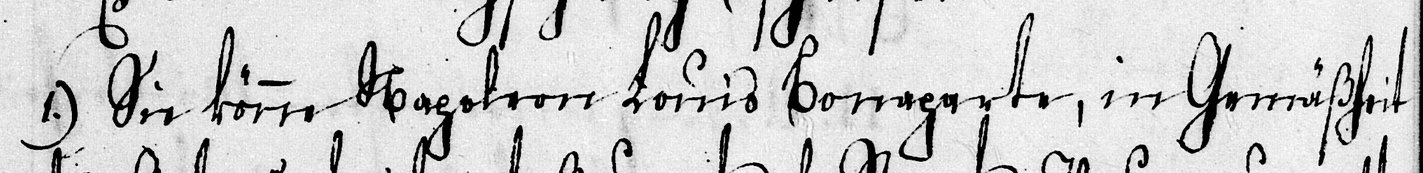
1.) Sie könne Napoleon Louis Bonaparte, in Gemäßheit
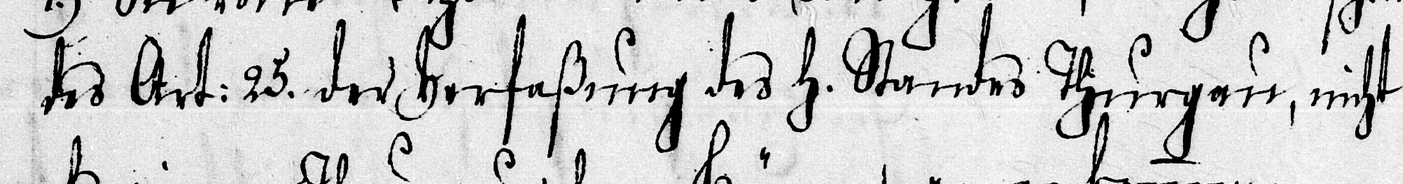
des Art: 25. der Verfaßung des H. Standes Thurgau nicht
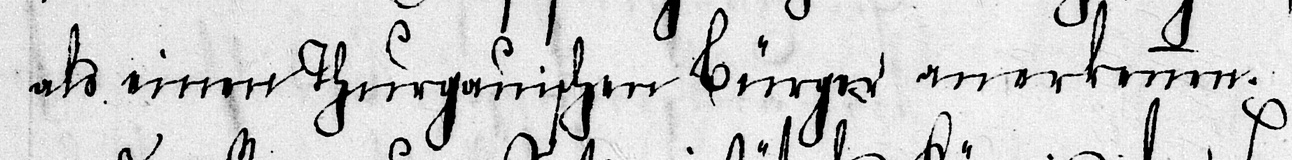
als einen Thurgauischen Bürger anerkennen.
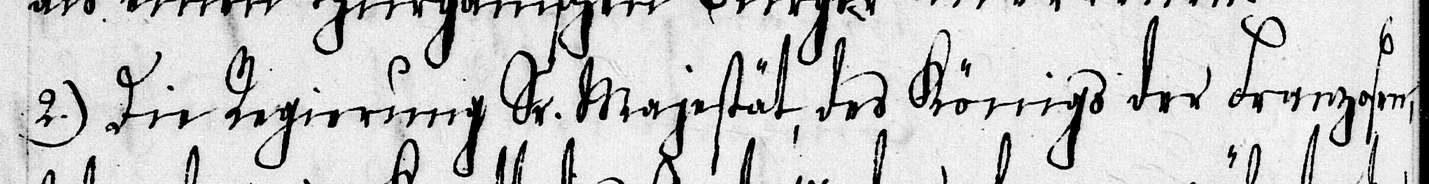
2.) Die Regierung Sr. Majestät, des Königs der Franzosen,
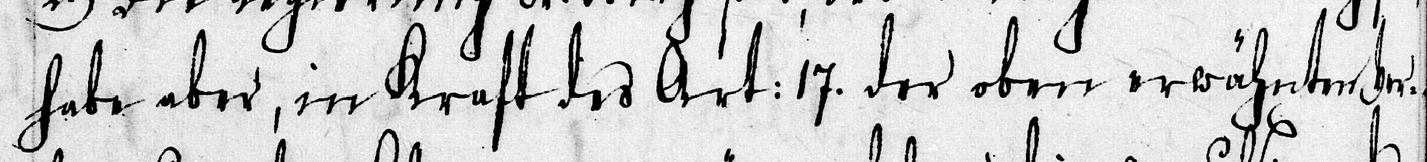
habe aber, in Kraft des Art: 17. der oben erwähnten Ve¬
